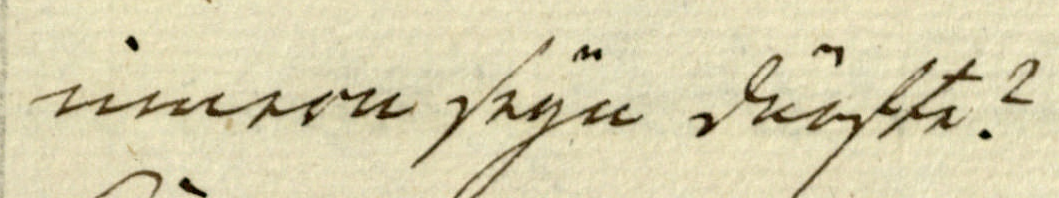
innern seÿn dürfte?
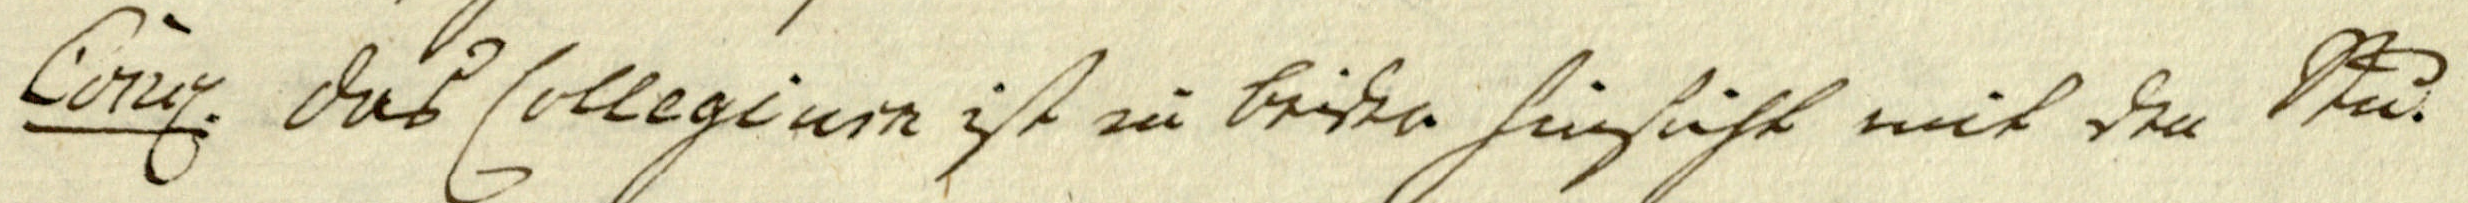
Concl. Das Collegium ist in beider hinsicht mit den Stu¬
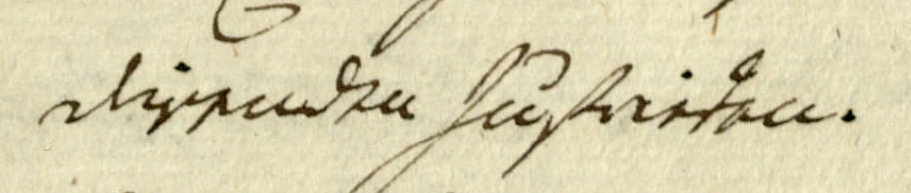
direnden zufrieden.
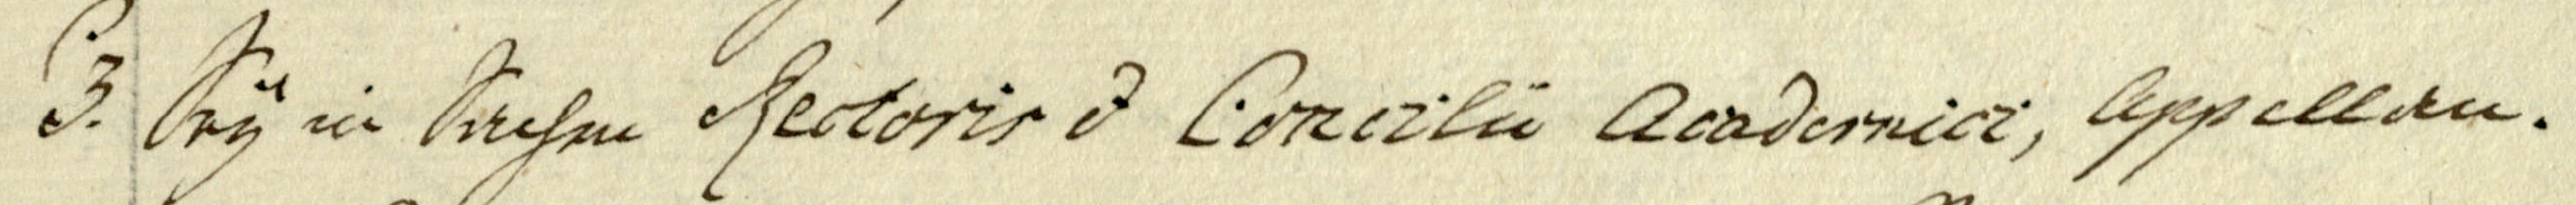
3. Seÿ in Sachen Rectoris et Concilii Academici, Appellan¬
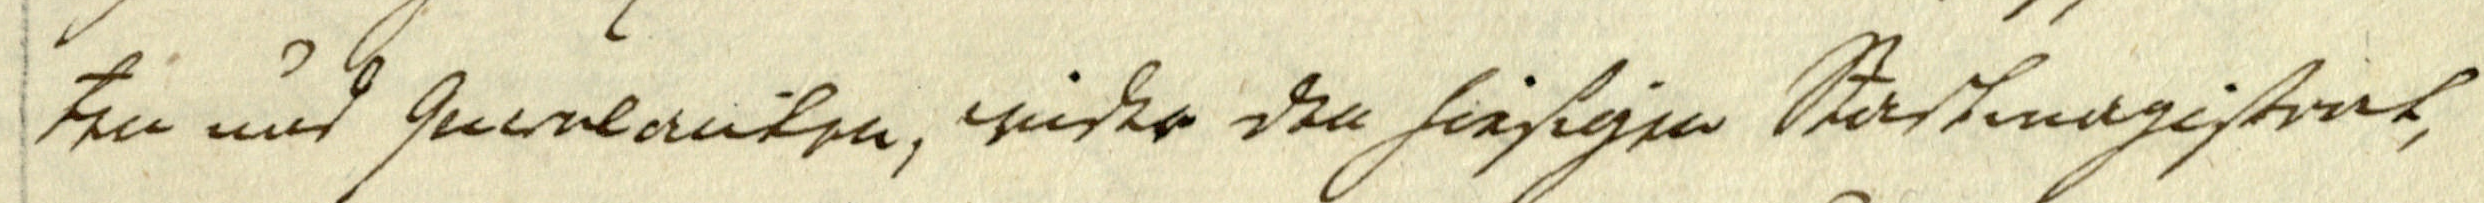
ten und Querulanten, wider den hiesigen Stadtmagistrat,
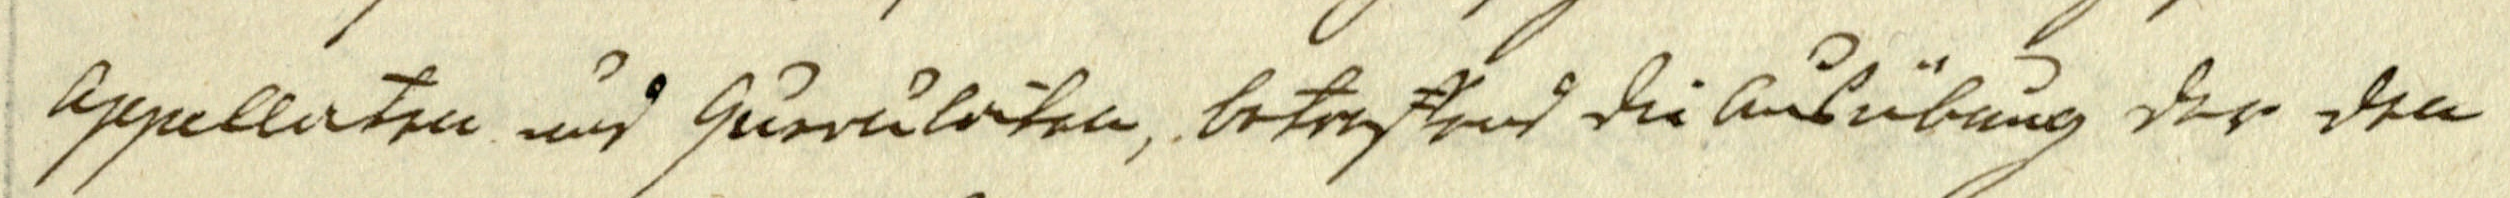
Appellaten und Querulaten, betreffend die Ausübung der den
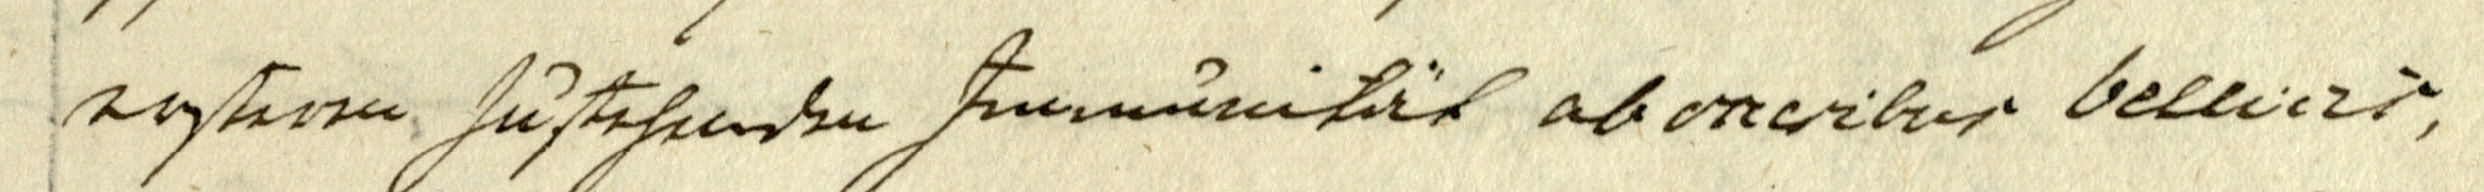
ersteren zustehenden Immunität ab oneribus bellicis
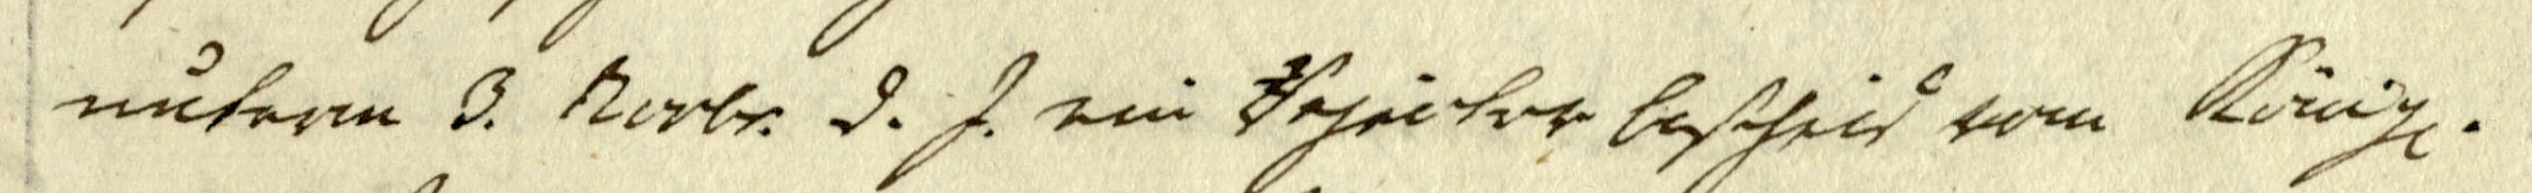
unterm 3. Novbr. d. J. ein Rejector Bescheid vom Königl
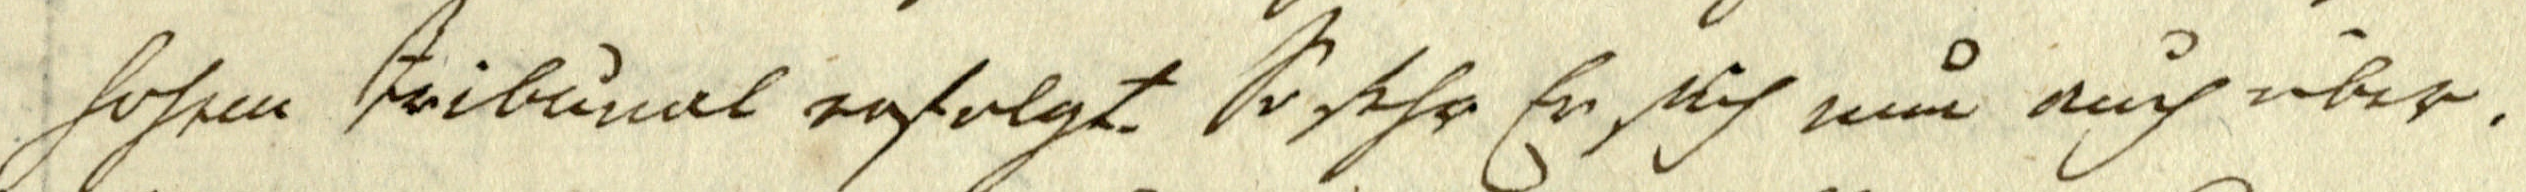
hohen Tribunal erfolgt. So sehr Er sich nun auch über¬
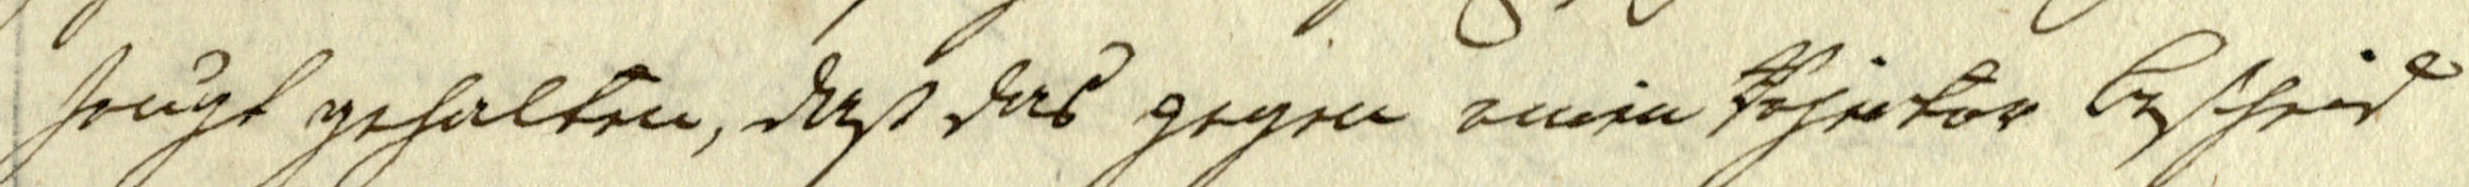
haupt gehalten, daß das gegen einen Rejector Bescheid
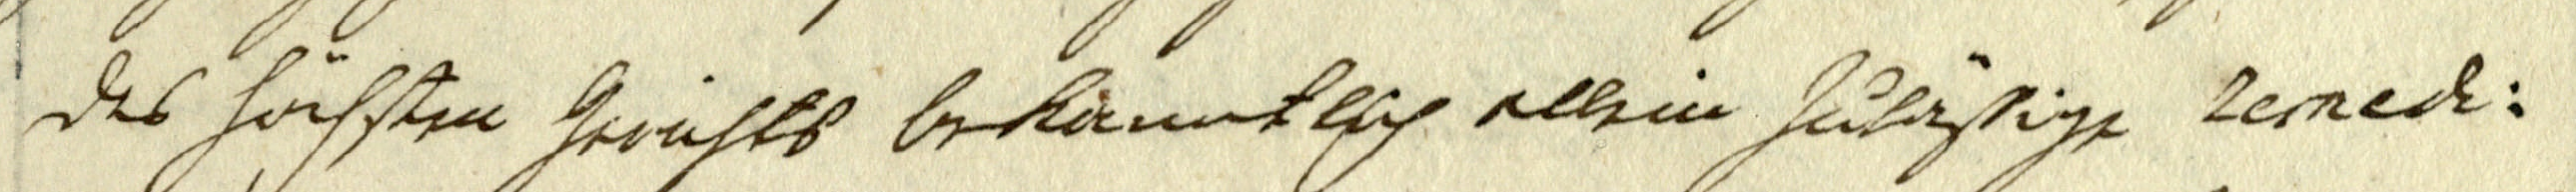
des höchsten Gerichts bekanntlich allein zulässige remedi¬
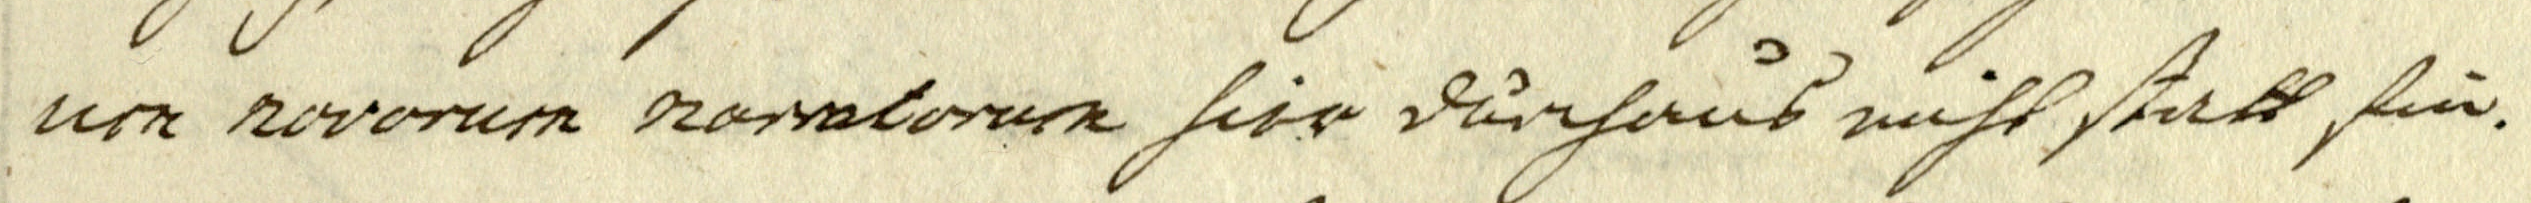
um novorum narratorum hier durchaus nicht statt fin¬
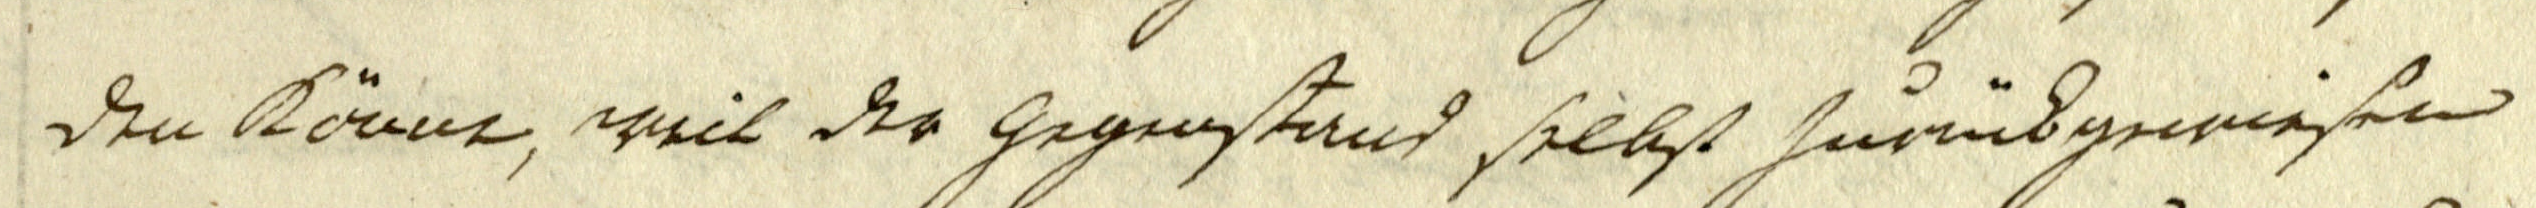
den könne, weil der Gegenstand selbst zurückgewiesen
